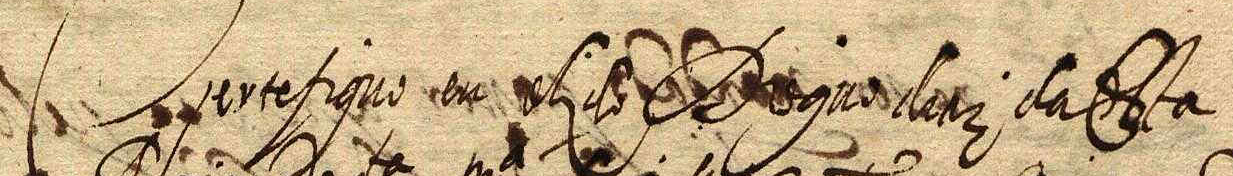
Certefiquo eu o Ldo Dioguo diaz da Costa
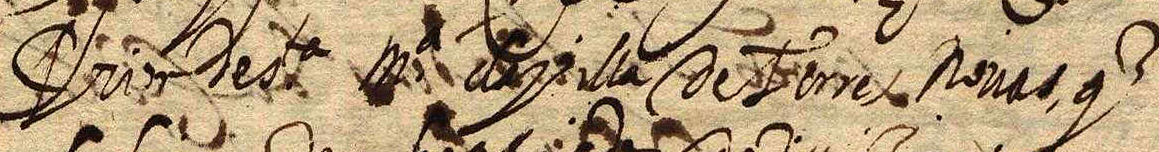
Prior de s.ta m.a da Villa de Torres nouas, q̄
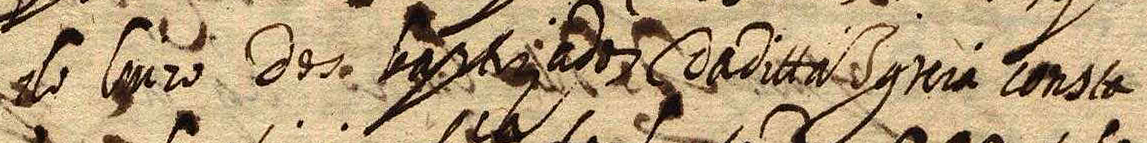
do liuro dos baptizados da ditta Igreia consta
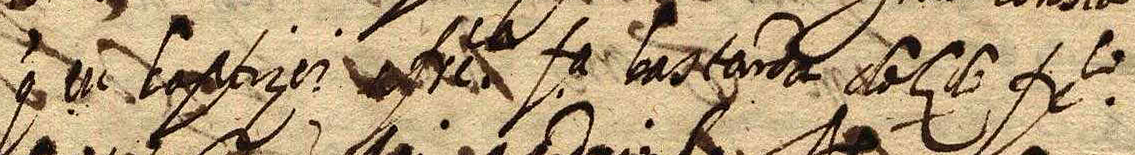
q̄ eu baptizei a frc.ca f.a bastarda do Ldo frco.
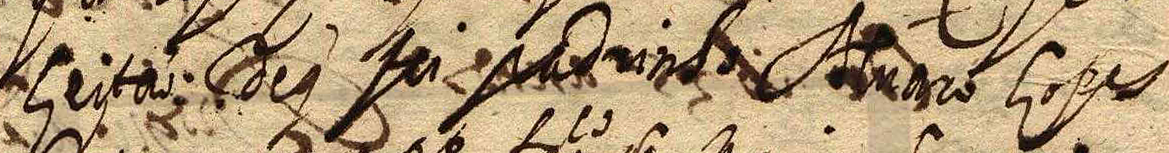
Leitaõ de q̄ foi padrinho Aluaro Lopes
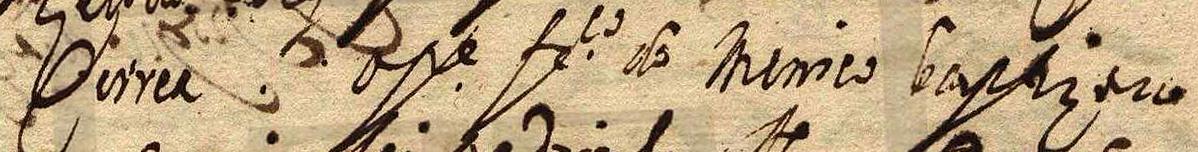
Correa. o p.e fr.co domenico baptizou
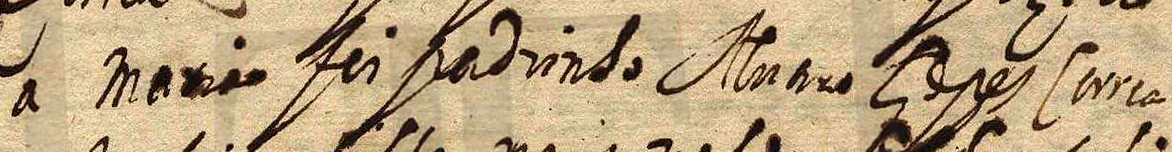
a Maria foi padrinho Aluaro Lopes Correa
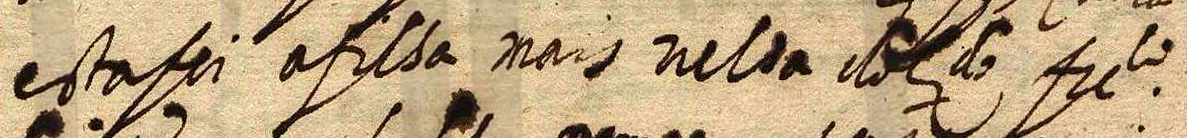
esta foi a filha mais uelha do Ldo frcco.
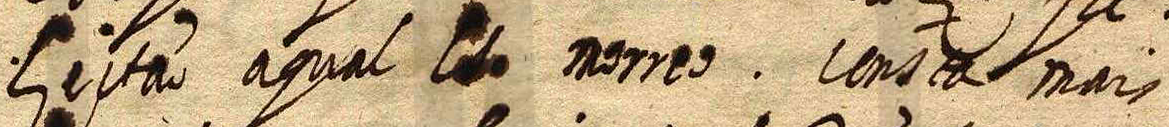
Leitaõ a qual lhe morreo. consta mais
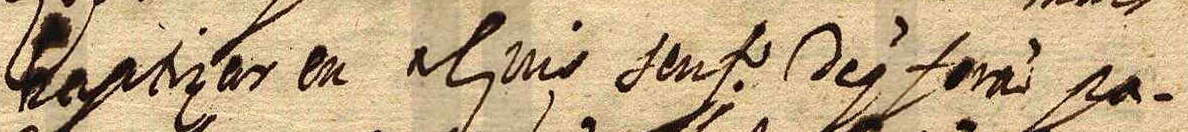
baptizar eu a Luis seu f.o de q̄ foraõ pa
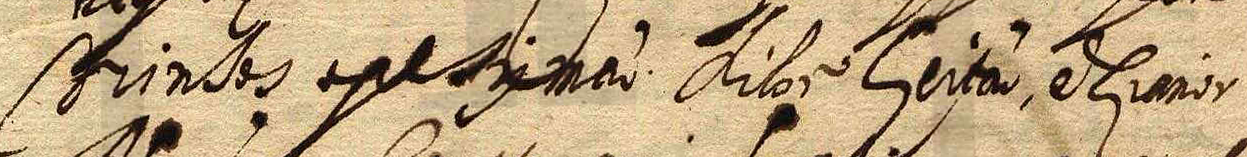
drinhos, o pe symaõ Ribro Leitaõ, e Lianor
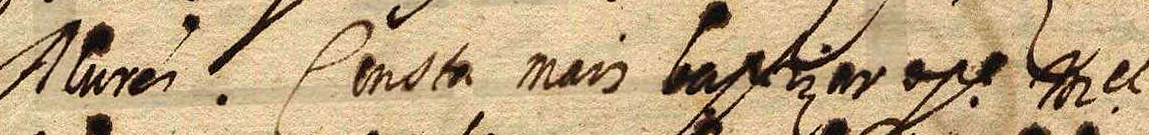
Alures̄. Consta mais baptizar o p.e me.l
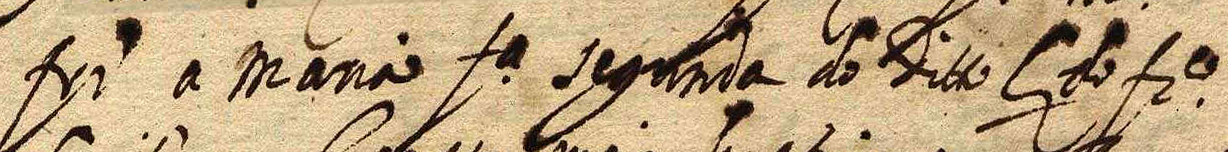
frz̄ a maria fa. segunda do ditto Ldo frco.
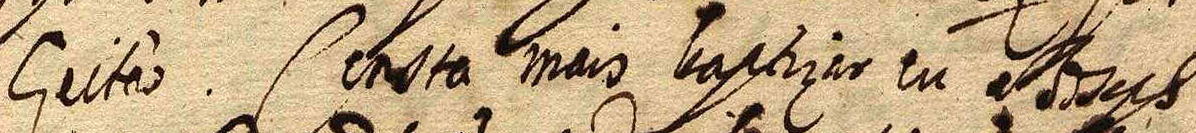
Leitaõ. Consta mais baptizar eu a Joseph
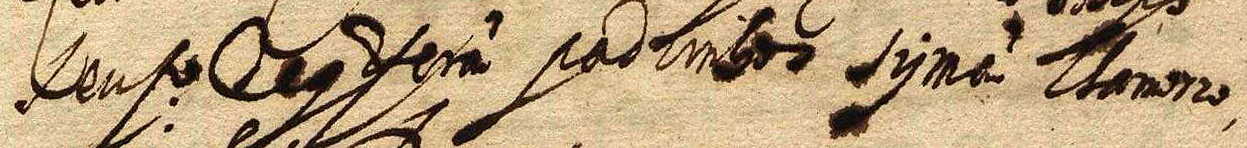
seu f.o de q̄ foraõ padrinhos symaõ Chamorro,
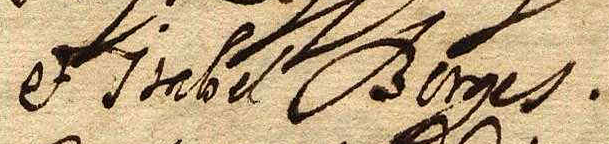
& Isabel Borges.
